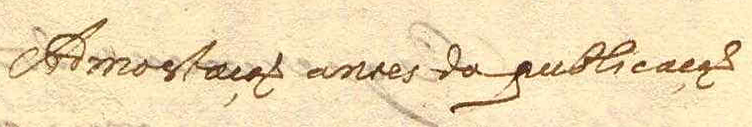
Admoestaçaõ antes da publicaçaõ
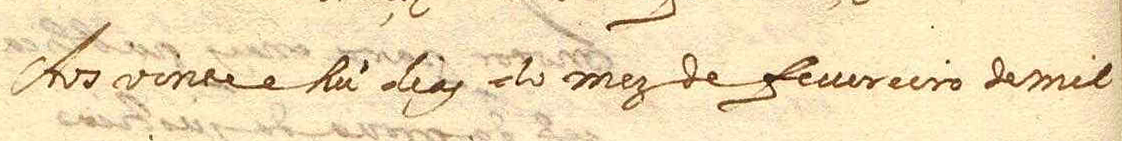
Aos vinte e hū dias do mez de feuereiro de mil
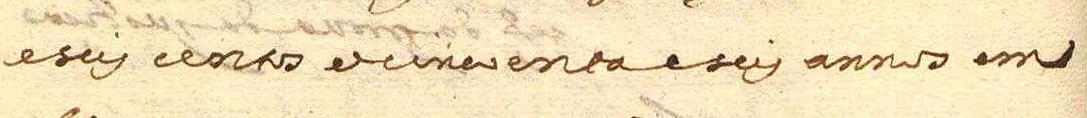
e seiscentos e cincoenta e seis annos em
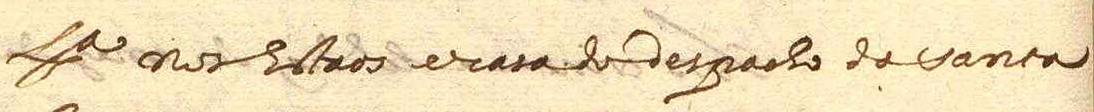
Lxa nos Estaos e casa do despacho da santa
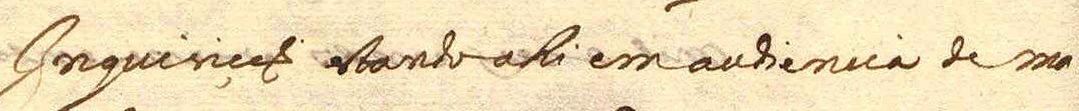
Jnquisiçaõ estando ahi em audiencia de ma
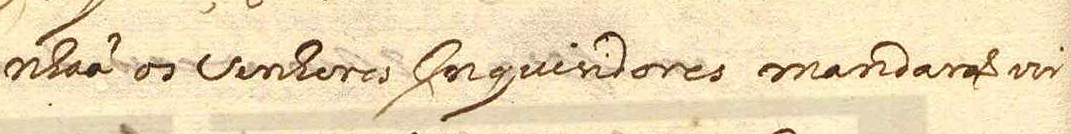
nhaã os Senhores Jnquisidores mandaraõ vir
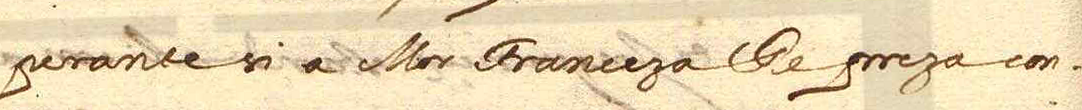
perante si a Mor Franceza Re preza con
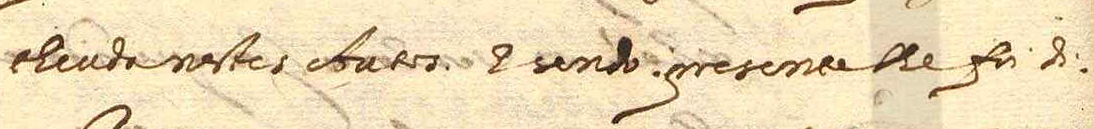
theuda nestes Autos. E sendo presente lhe foi di
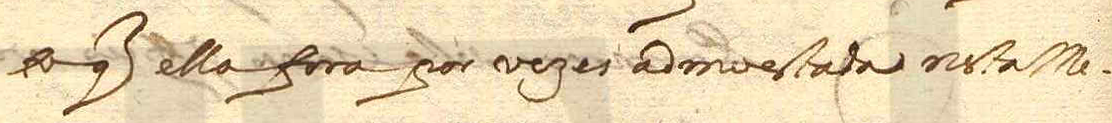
to q̄ ella fora por vezes admoestada nesta Me
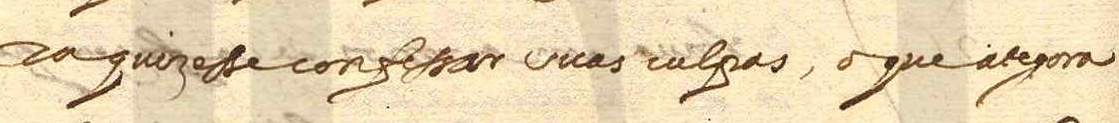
za quizesse confessar suas culpas, o que ate gora
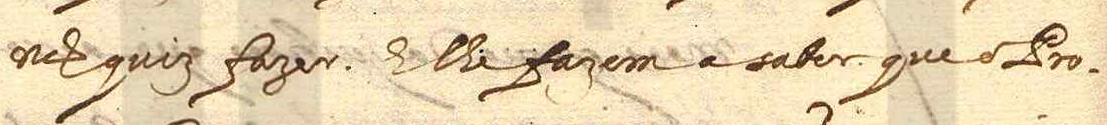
naõ quiz fazer. E lhe fazem a saber que o Pro
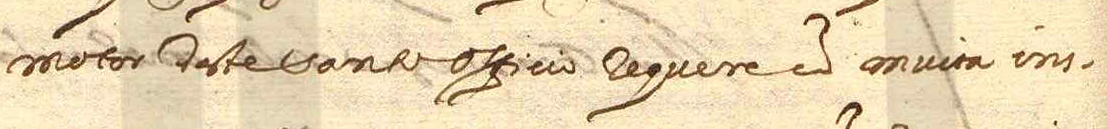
motor deste santo officio Requere cō muita ins
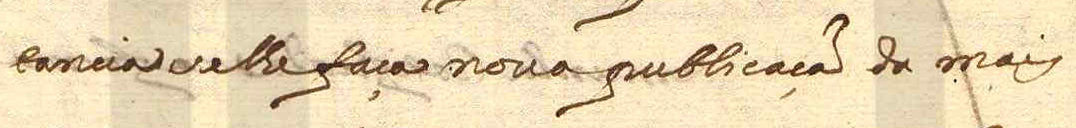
tancia se lhe faça noua publicaçaõ da mais
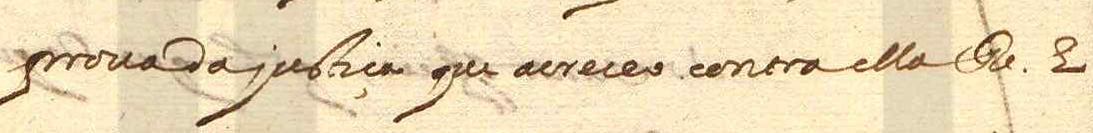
proua da justiça que acreceo contra ella Re. E
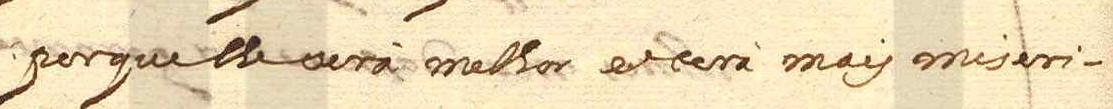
porque lhe será melhor e terá mais miseri
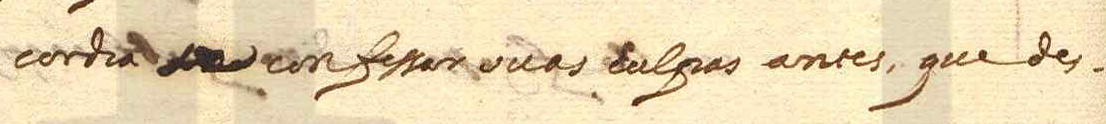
cordia s_ confessar suas culpas antes, que des
